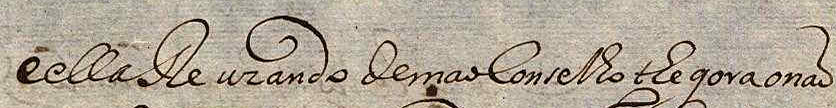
e ella Re uzando de mao Conselho the gora o naõ
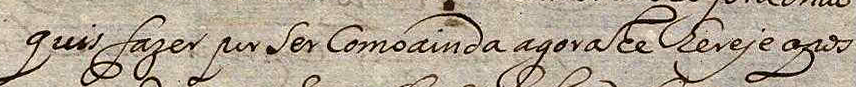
quis fazer por ser Como ainda agora he hereje apos
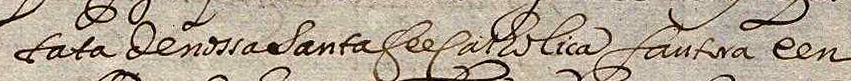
tata de nossa Santa fee Catholica fautora e en
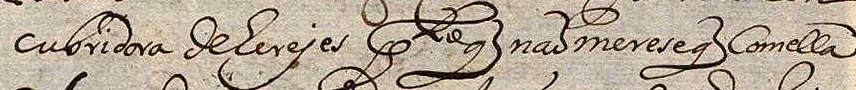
cubridora de herejes plo q̄ naõ merese q̄ Com ella
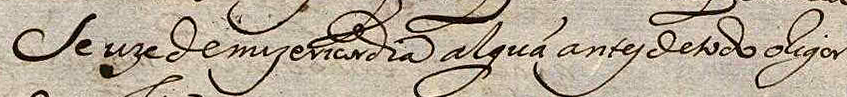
Se uze de mizericordia alguā antes de todo o Rigor
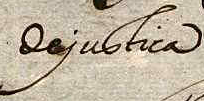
de justiça
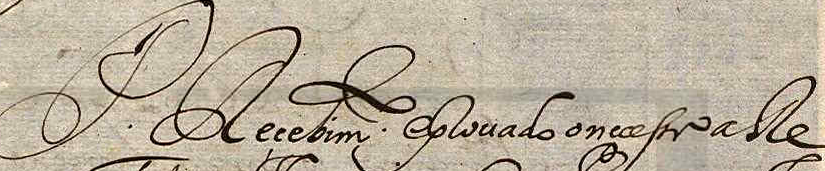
P Recebim.to e pRouado o necessro a Re
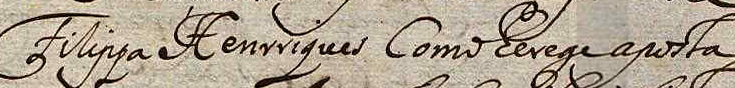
Filippa Henrriques Como herege aposta
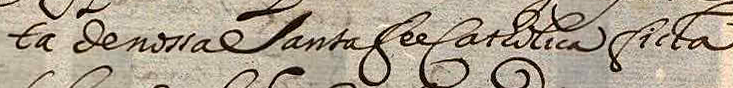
ta de nossa Santa fee Catholica ficta
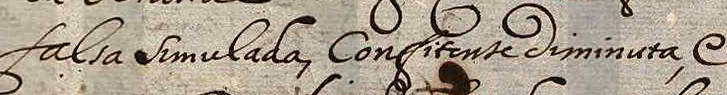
falsa simulada, Confitente diminuta, E
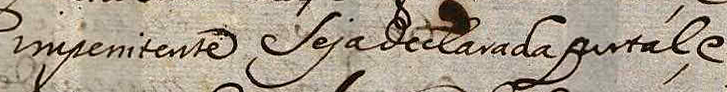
impenitente Seja declarada por tal, e
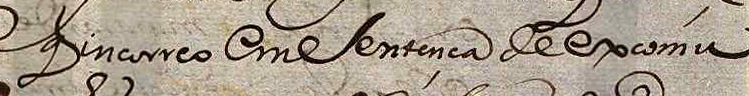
q̄ incorreo em Sentença de excomu
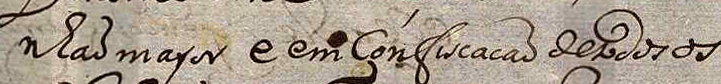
nhaõ mayor e em Confiscaçaõ de todos os
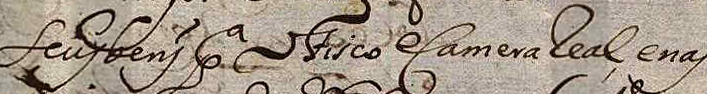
Seus bens̄ pa o Fisco e Camera Real, e nas
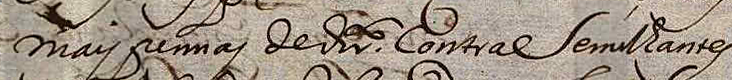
mais pennas de dir.to Contra Semelhantes
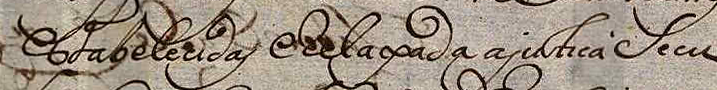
Estabelecidas e Relaxada a justiça Secu
